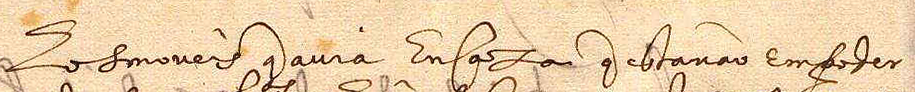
E os moueis q̄ auia En Caza q̄ estauão Em poder
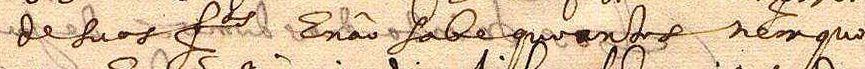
de suas fas E não sabe quoantos nem quo
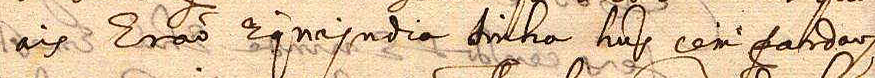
ais Erão E q̄ na jndia tinha hūs cem pardaos
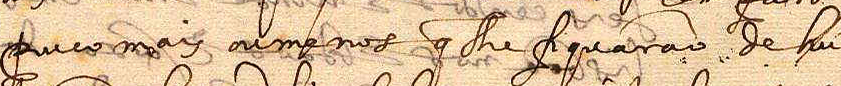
pouco mais ou menos q̄ lhe fiquarão de hū
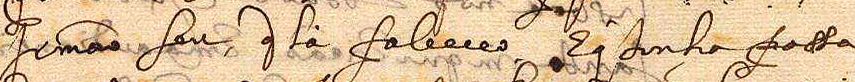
Jrmão seu, q̄ la falecceo E q̄ tinha passa
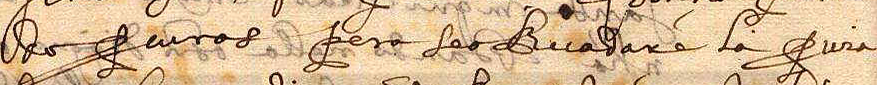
do ꝓcuras pera se aRecadarē La ꝓuiza
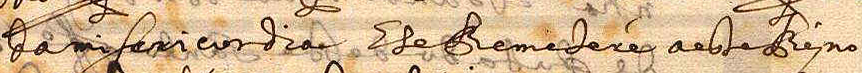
da misericordia E se Remeterē a este Rejno
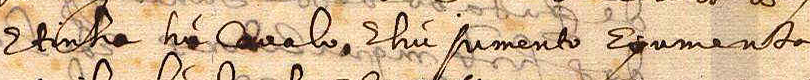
E tinha hū Caualo, E hū jumento E jumenta
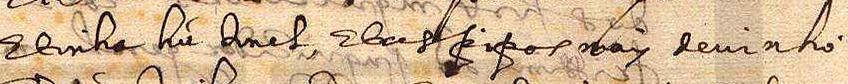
E tinha hū tonel, E tres pipos mais de uinho
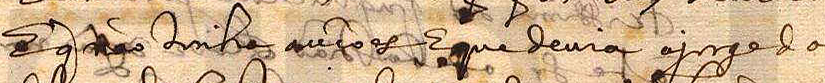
E q̄ não tinha aucões E que deuia a jorge da
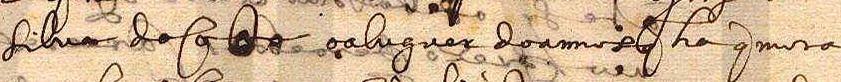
silua da Costa o aluguer do annos q̄ ha q̄ mora
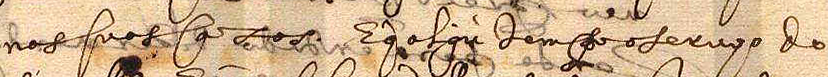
nas suas Cazas. E q̄ algū tempo o seruyo do
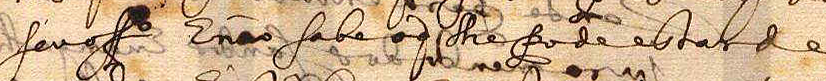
seu offo E não sabe o q̄ lhe pode estar de
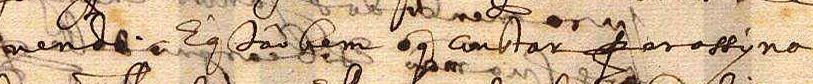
uendo. E q̄ taõbem o q̄ constar per assyna
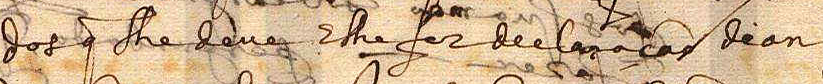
dos q̄ lhe deue E lhe fez declaração dean
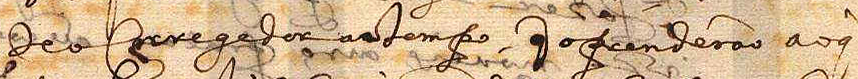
te o Corregedor ao tempo, q̄ o prenderão ao q̄
